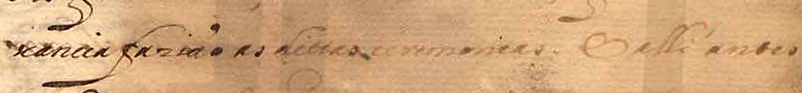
uancia faziaõ as dittas ceremonias. E alli antes
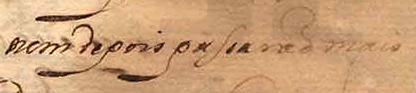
nem depois passaraõ mais
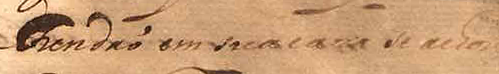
Fundaõ em sua caza se achou
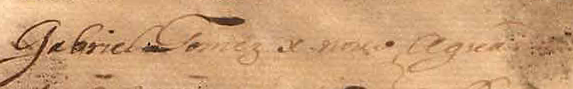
Gabriel Tomaz x nouo, agua
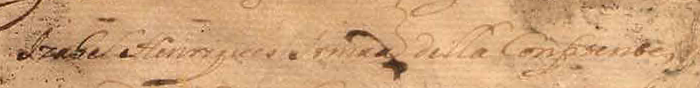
Izabel Henriques Irmaã della Confitente
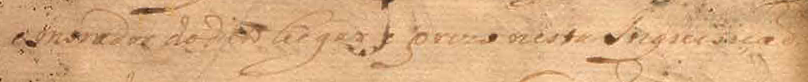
e morador do dito lugar e prezo nesta Inquisiçaõ
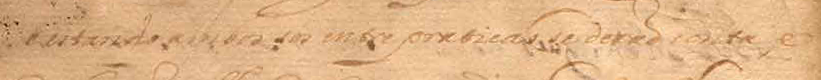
e estando ambos sos entre praticas se deraõ conta, e
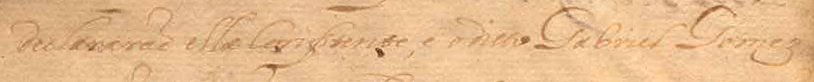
declararaõ ella Confitente, e o ditto Gabriel Gomez
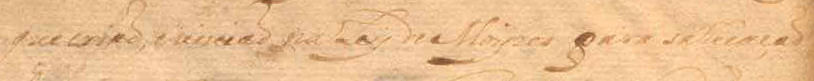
que criaõ, e uiuiaõ na Ley de Moyzes para saluaçaõ
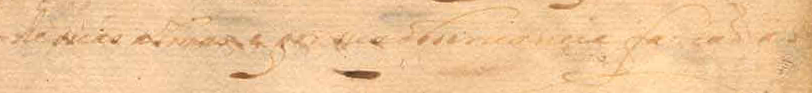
de suas almas e por sua obseruancia faziaõ as
